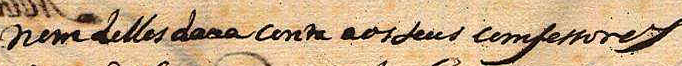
nem delles daua conta aos seus comfessores
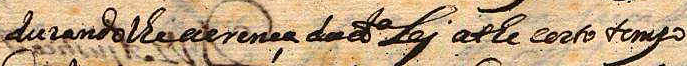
durandolhe a crença da d̄a Lej athe certo tempo
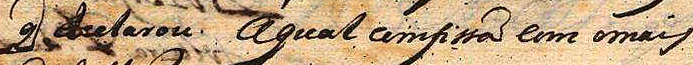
q̄ declarou. A qual comfissā com o mais
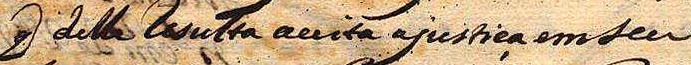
q̄ della Resulta aceita a justiça em seu
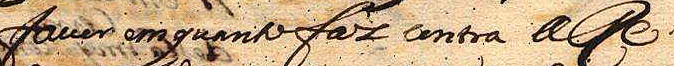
fauor em quanto faz contra a Re.
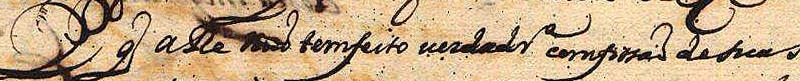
P q̄ a Re naõ tem feito uerdadra comfissaõ de suas
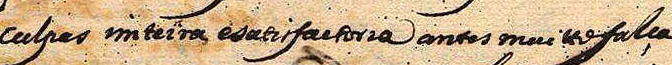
culpas imteira e satisfactoria antes muitto falça
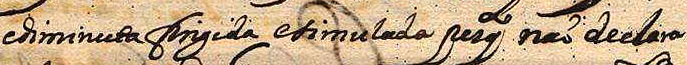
e diminuta fingida e simulada perqto naõ declara
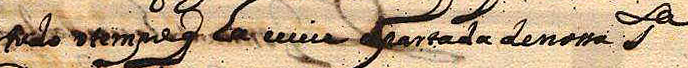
todo o tempo q̄ ha uiue apartada de nossa Sta
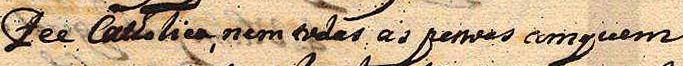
Fee Catholica, nem todas as pessoas com quem
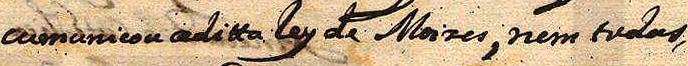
cumunicou a ditta ley de Moizes, nem todas,
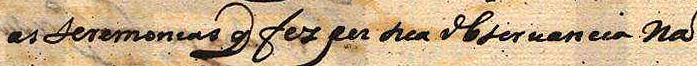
as seremonias q̄ fez per sua obseruancia nā
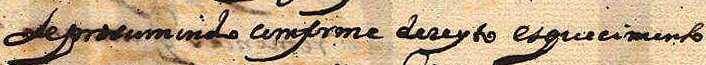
Se prezumindo comforme dereyto esquecimento
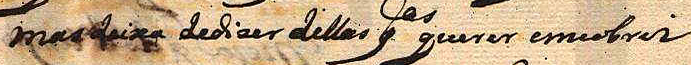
mas deixa de dizer dellas plas querer emcobrir
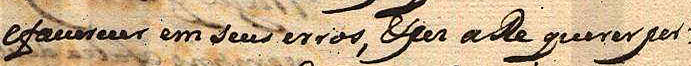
e fauorecer em seus erros, & per a Re querer per
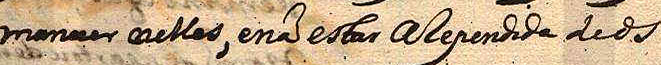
manecer nelles, e nā estar aRependida de os
